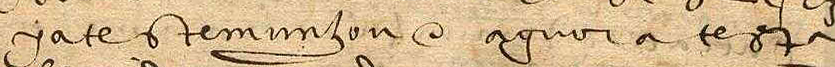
q̄ ya testemunhou e aguora testa
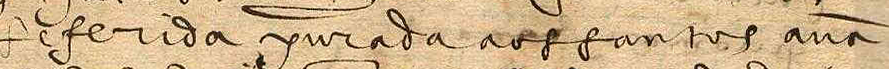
Referida jurada aos santos aūa
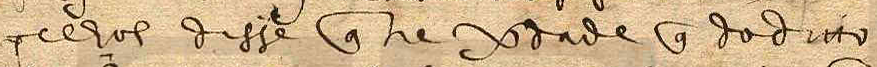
gelhos disse q̄ he ꝟdade q̄ do ditto
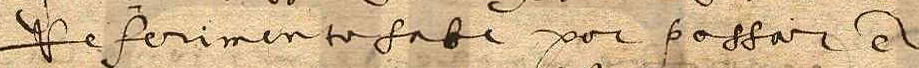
Referimento sabe por passar ē
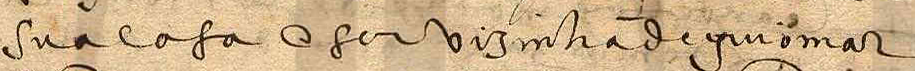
sua casa e ser vizinha de guiomar
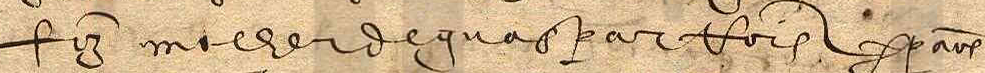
fr̄z molher de guaspar Roīs xpãos
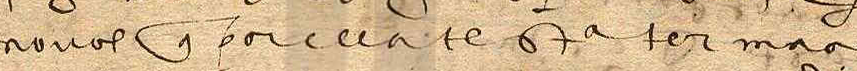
nouos q̄ por ella testa ter maa
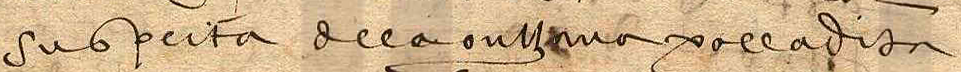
suspeita dela oulhaua polla dita
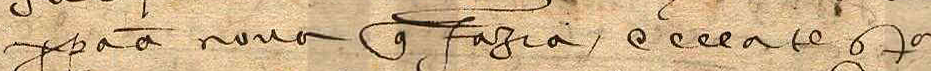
xpāa noua q̄ fazia / e ella testa
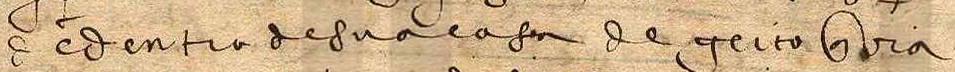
de dentro de sua casa de geito q̄ via
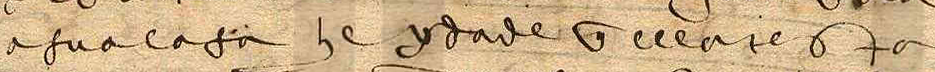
a sua casa he ꝟdade q̄ ella testa
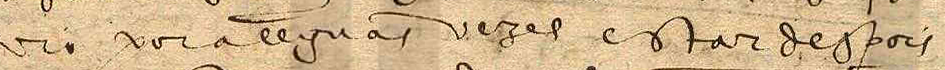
vio por allguās vezes estar despois
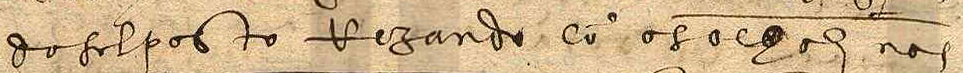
do sol posto Rezando cō os olhos nas
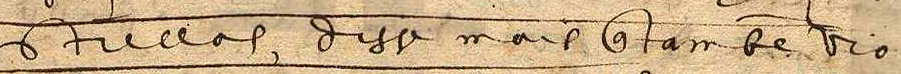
estrellas, disse mais q̄ tambē vio
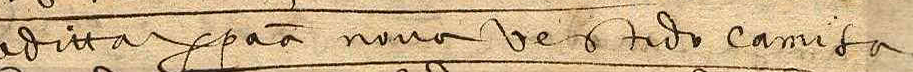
a ditta xpāa noua vestido camisa
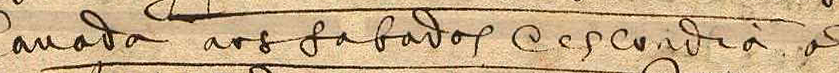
lauada aos sabados e escondia os
